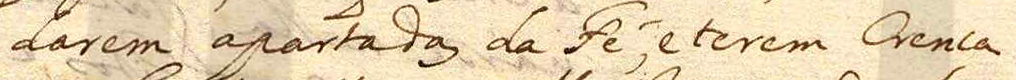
darem apartadas da Fé, e terem Crença
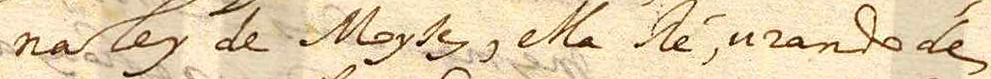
na Ley de Moyses, ella Ré, uzando de
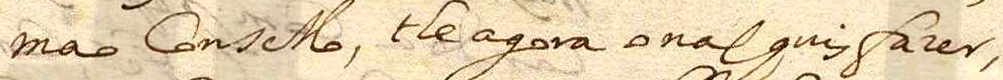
mao Conselho, the agora o naõ quis fazer,
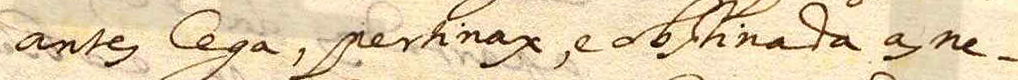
antes Cega, pertinax, e obstinada as ne
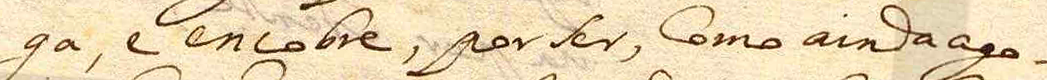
ga, e encobre, por ser, Como ainda ago
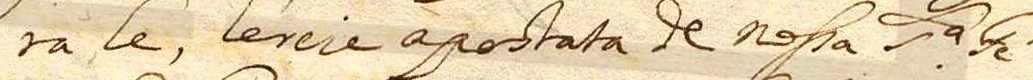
ra he, hereie apostata de nossa s.ta Fé
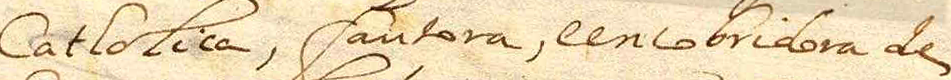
Catholica, fautora, e encobridora de
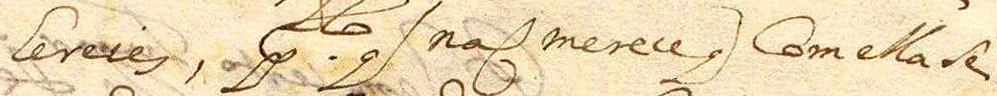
hereies, p.lo q̄ naõ merece q̄ Com ella se
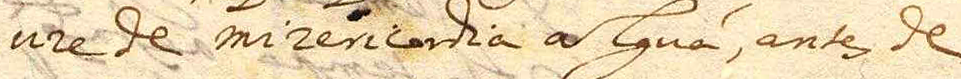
uze de mizericordia alguā, antes de
